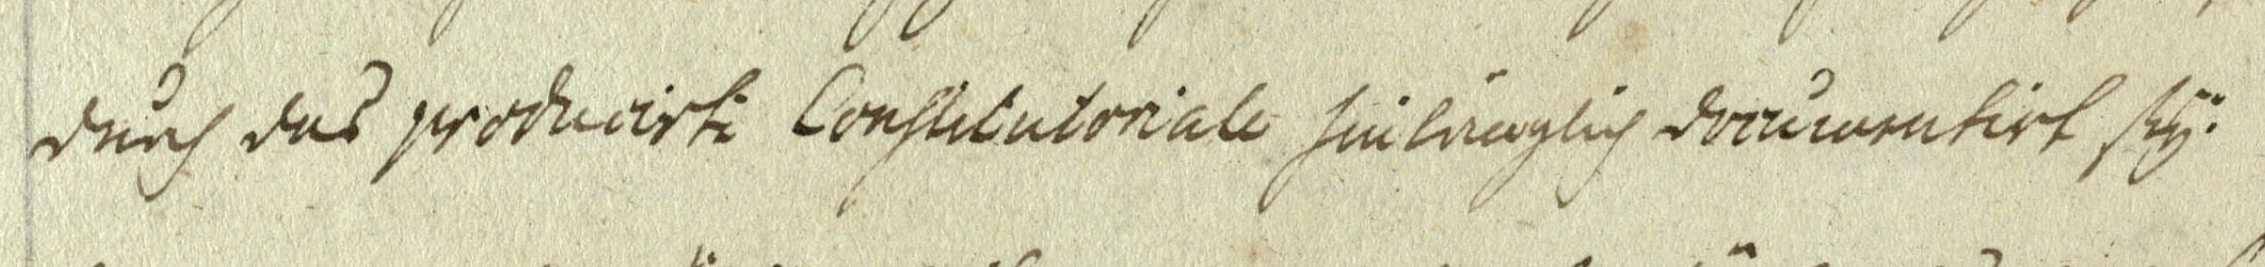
durch das producirte Constitutoriale hinlänglich documentirt seÿ.
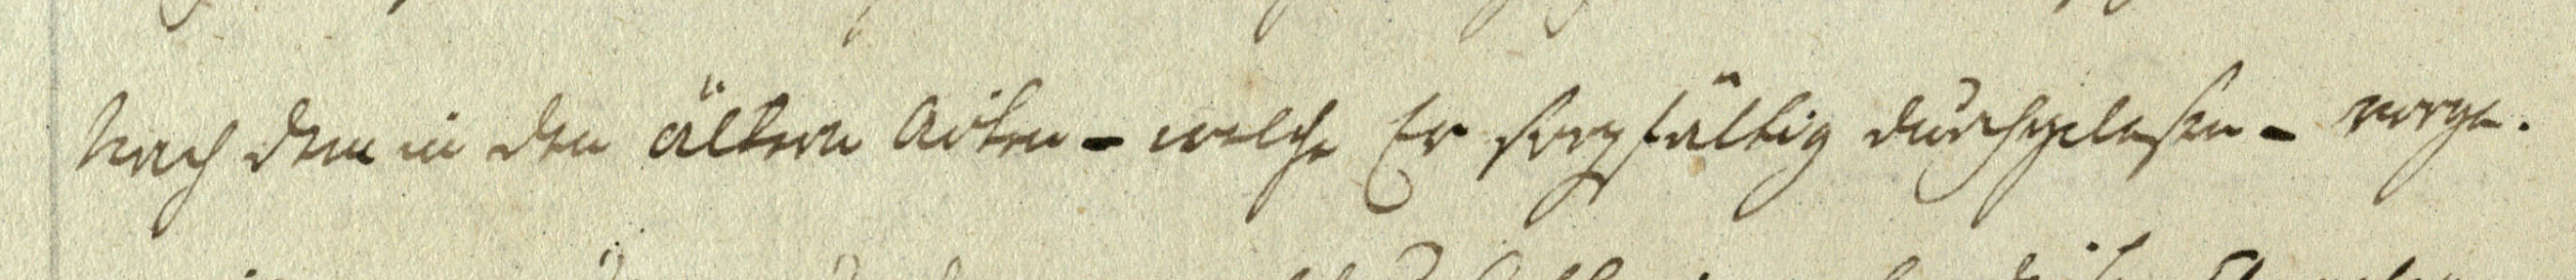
Nach dem in den ältern Acten - welche Er sorgfältig durchgelesen - vorge¬
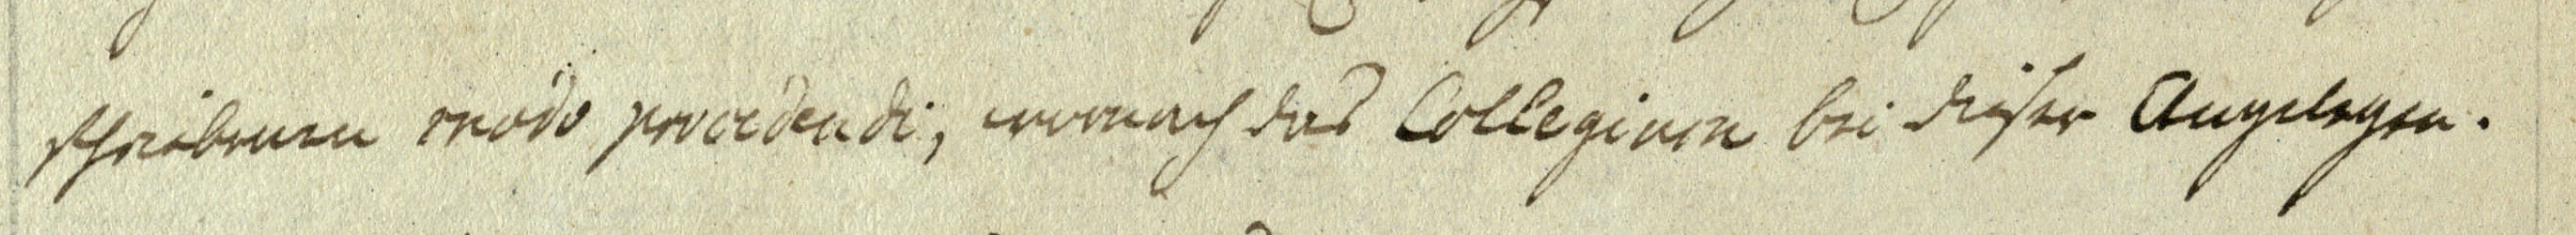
schriebenen modo procedendi, wornach das Collegium bei dieser Angelegen¬
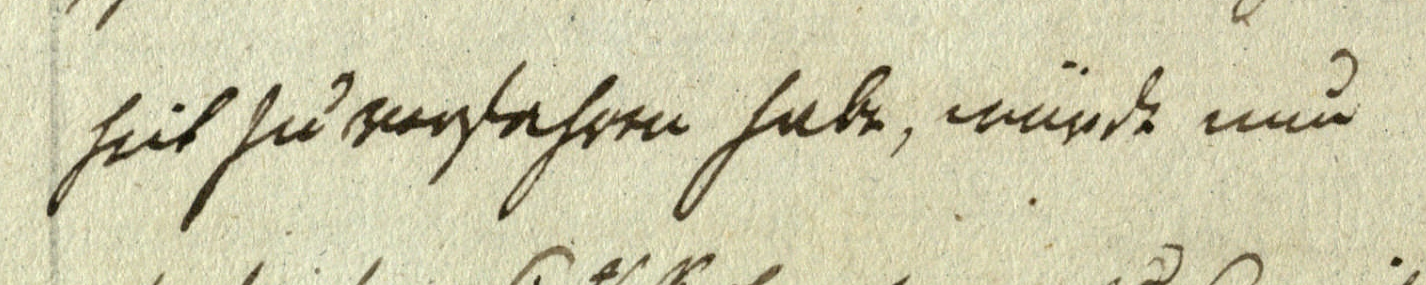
heit zu verfahren habe, würde nun
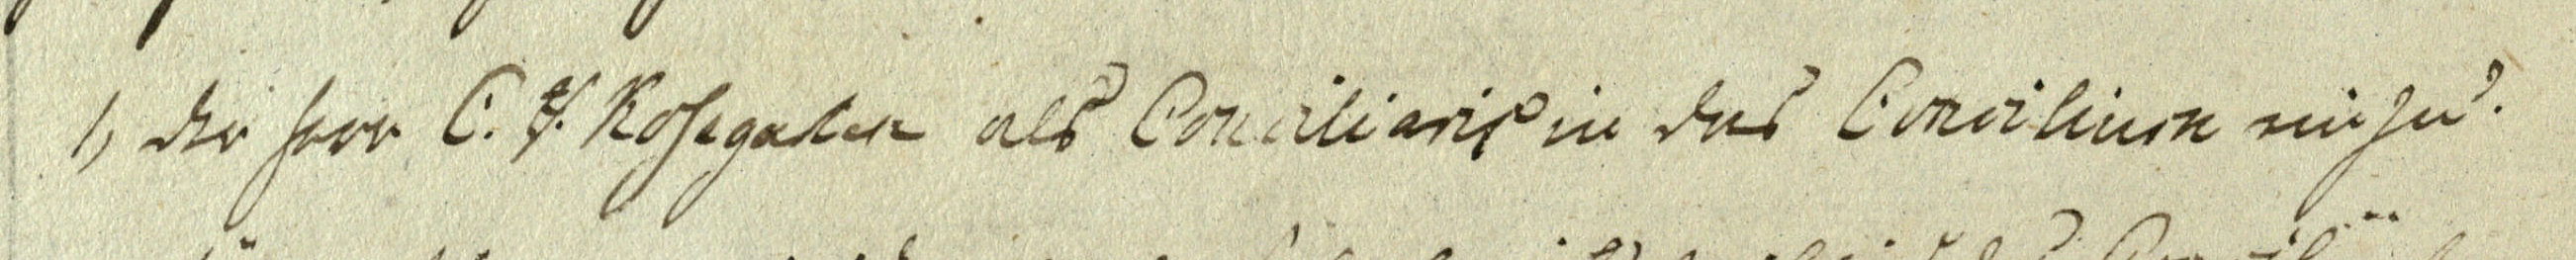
1, der Herr C. R. Kosegarten als Conciliaris in das Concilium einzu¬
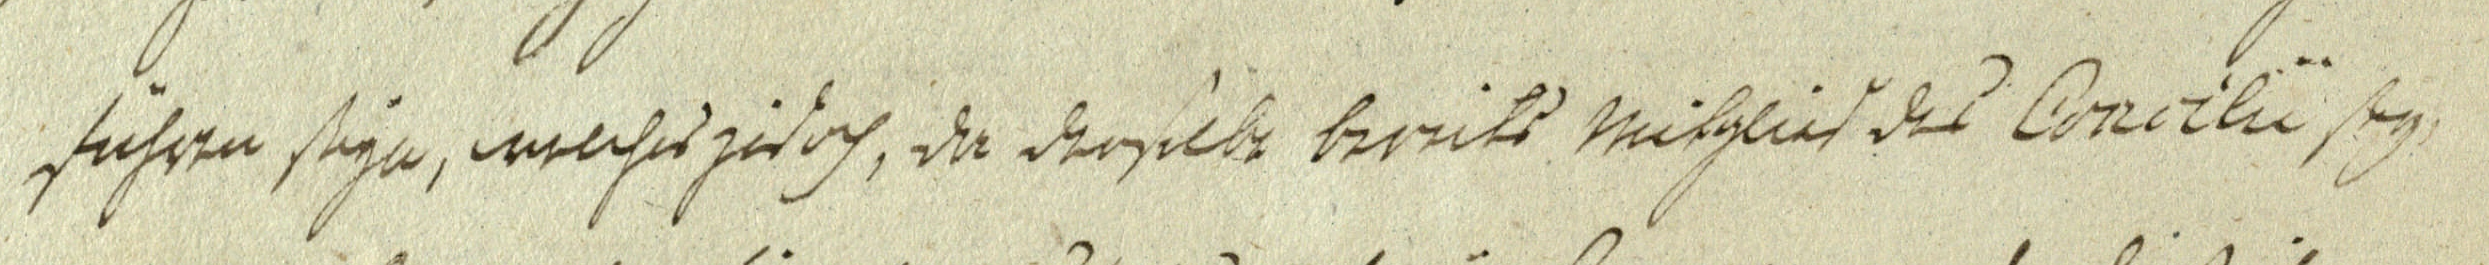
führen seÿn, welches jedoch, da derselbe bereits Mitglied des Concilii seÿ,
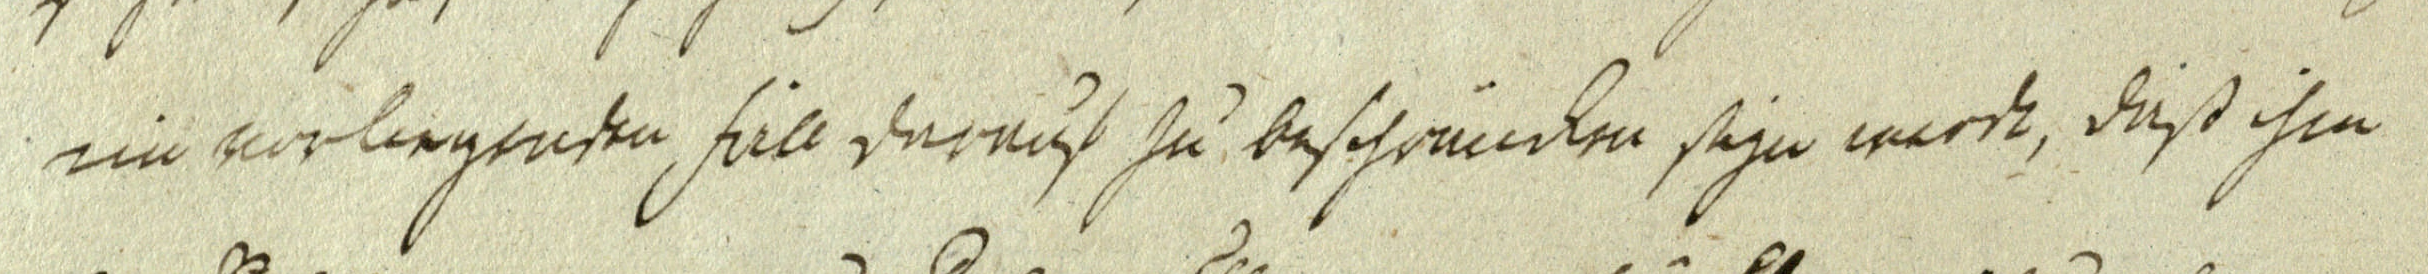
im vorliegenden Fall darauf zu beschräncken seÿn werde, daß ihm
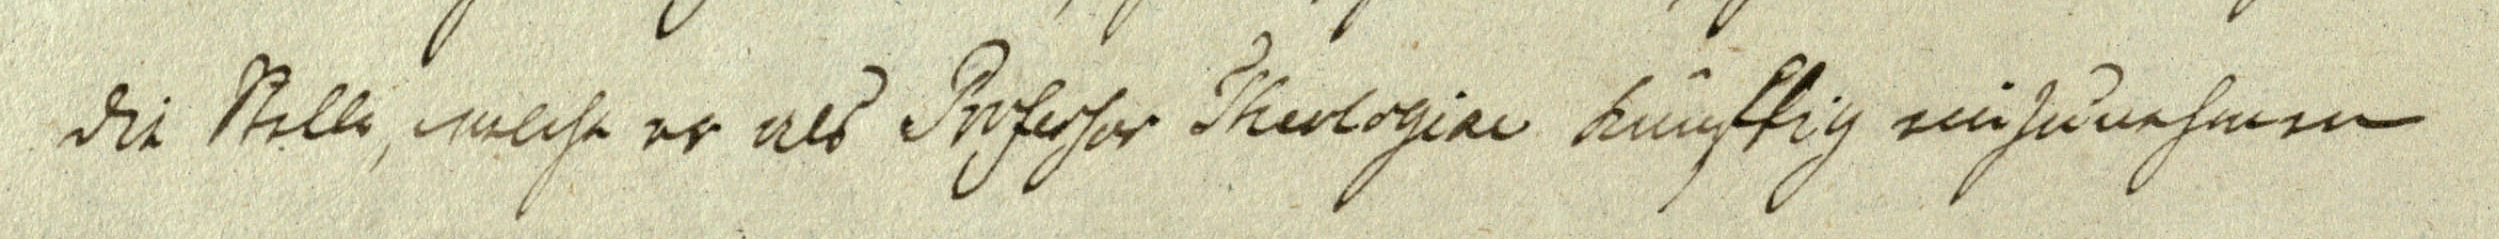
die Stelle, welche er als Professor Theologiae künftig einzunehmen
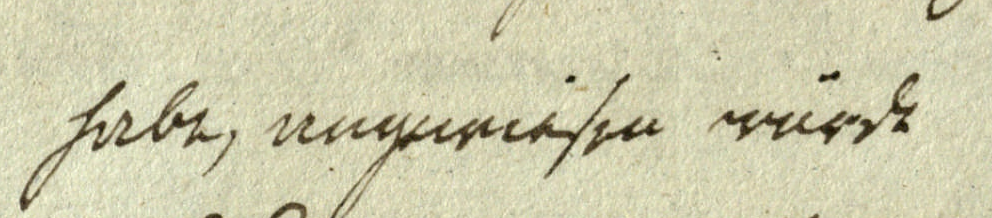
habe, angewiesen würde.
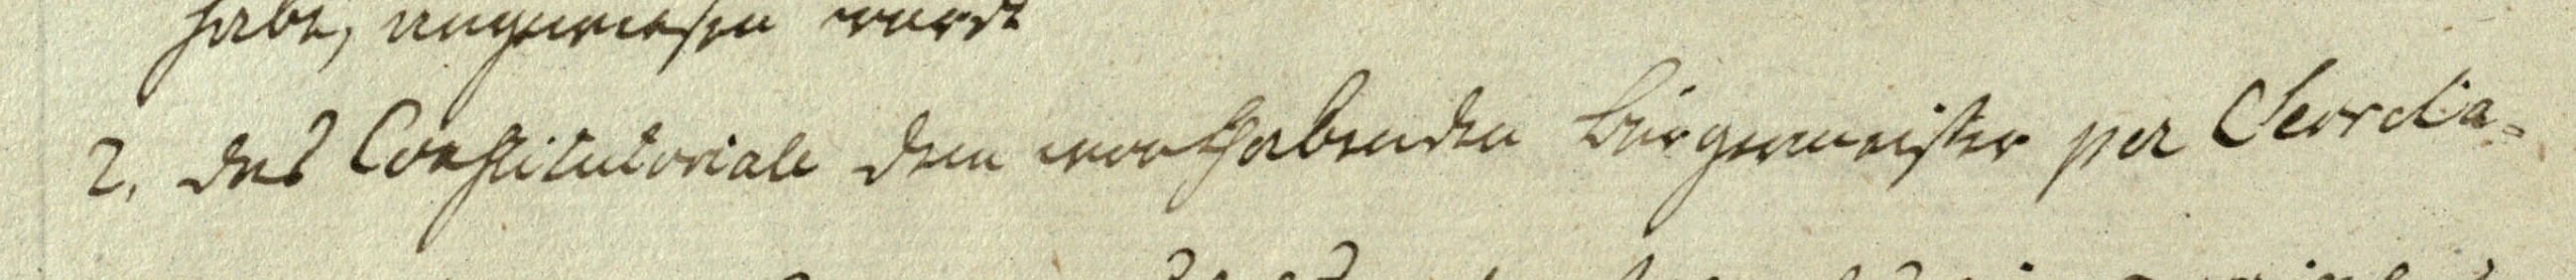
2, das Constitutoriale dem worthabenden Bürgermeister per Secreta¬
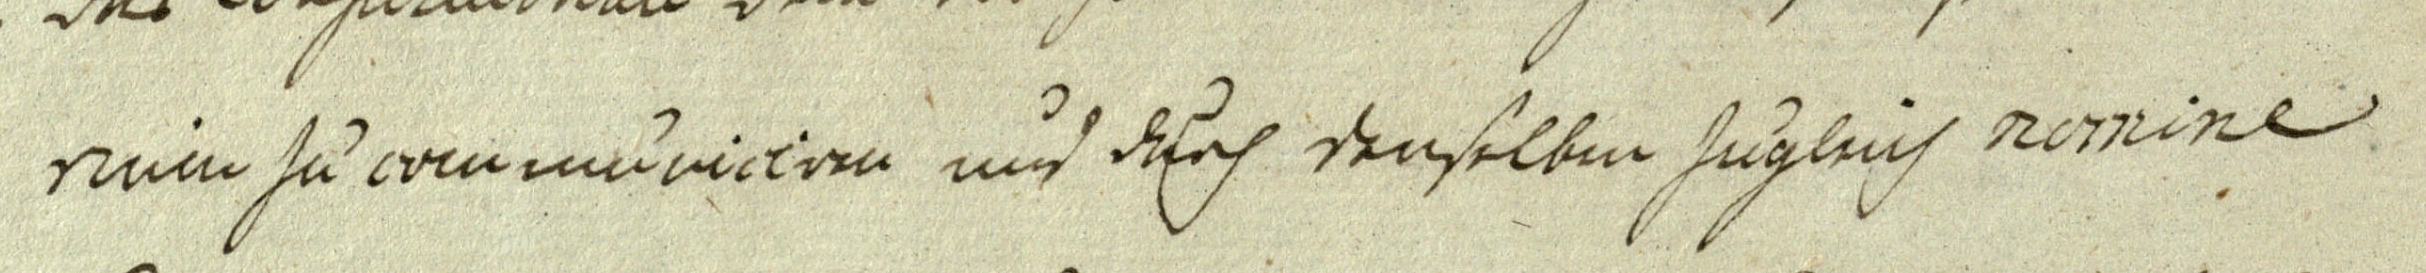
rium zu communiciren und durch denselben zugleich nomine
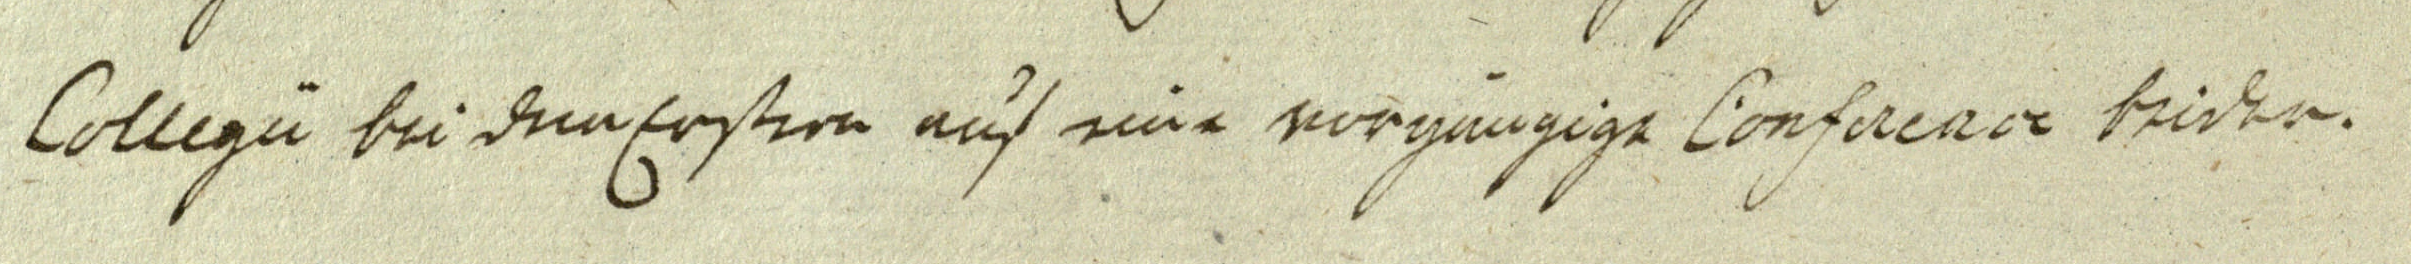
Collegii bei dem Erstern auf eine vorgängige Conference beider¬
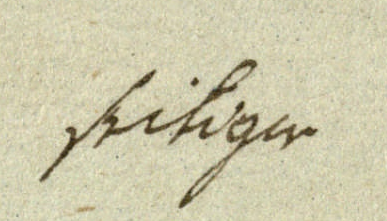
seitiger
